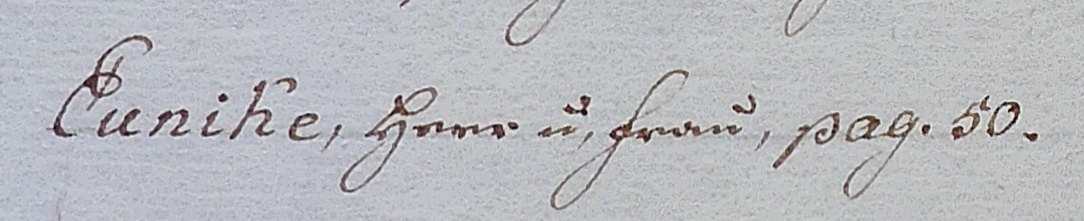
Eunike, Herr u, Frau, pag. 50.
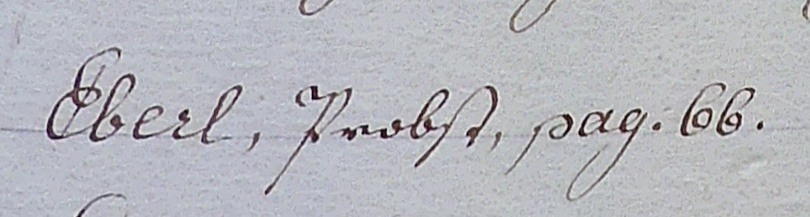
Eberl, Probst, pag. 66.
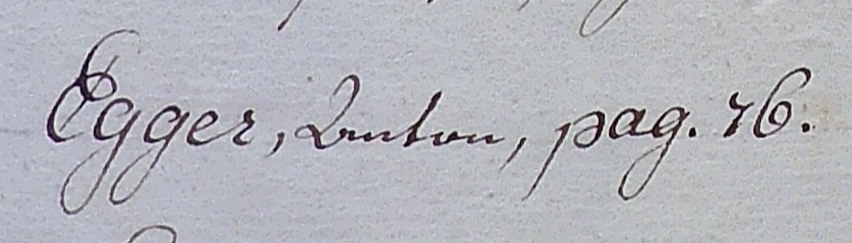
Egger, Anton, pag. 76.
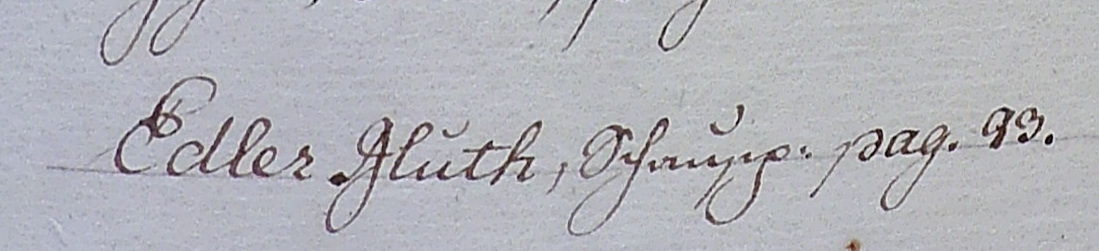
Edler Muth, Schausp: pag. 93.
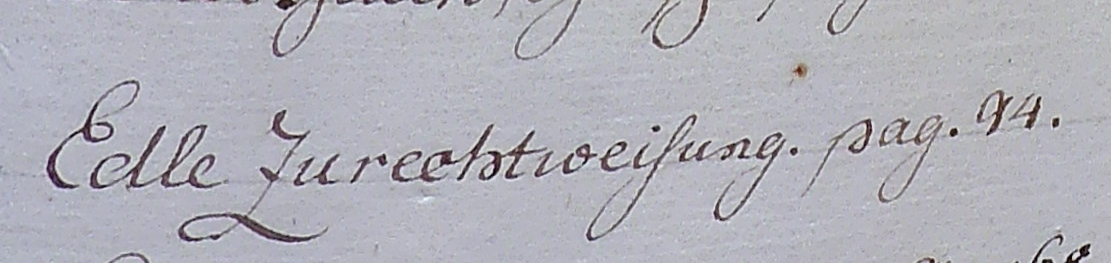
Edle Zurechtweisung. pag. 94.
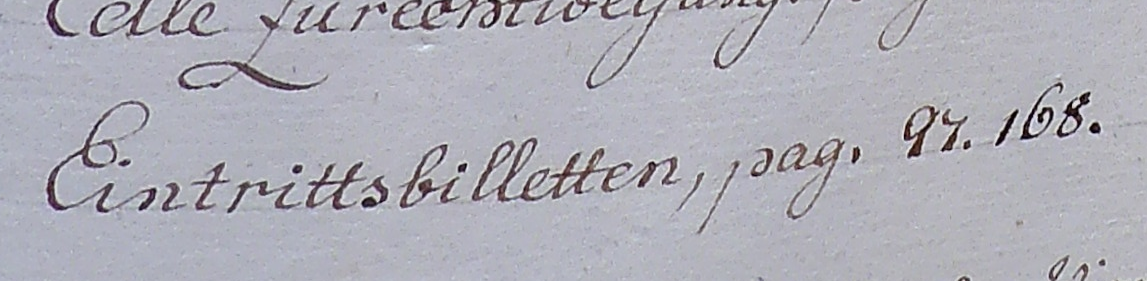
Eintrittsbilletten, pag. 97. 168.
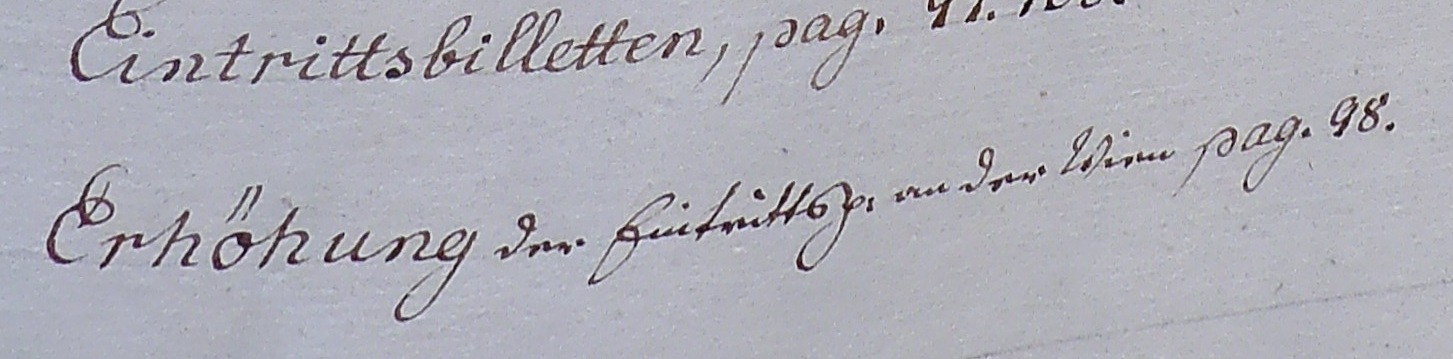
Erhöhung der Eintrittsp: an der Wien pag. 98.
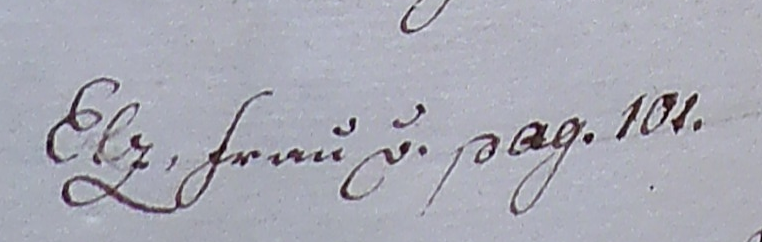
Elz, Frau v. pag. 101.
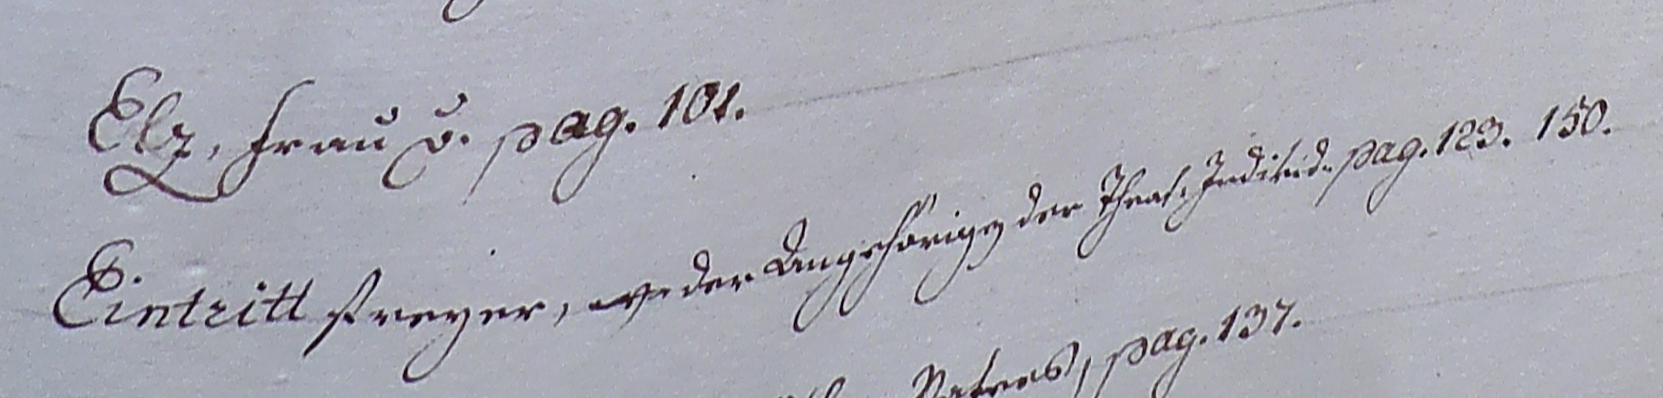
Eintritt freyer, wgn der Angehörigen der Theat: Individ: pag. 123. 150.
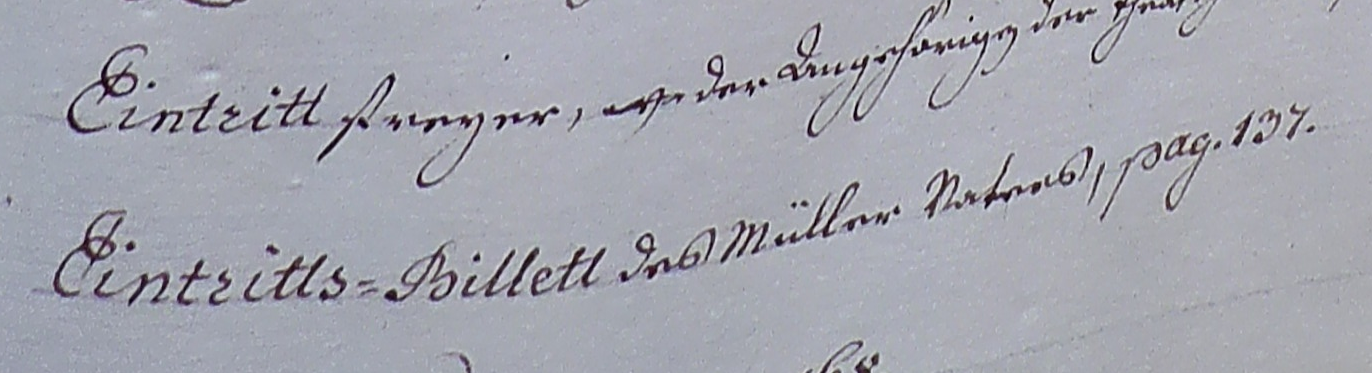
Eintritts‗Billett des Müller Vaters, pag. 137.
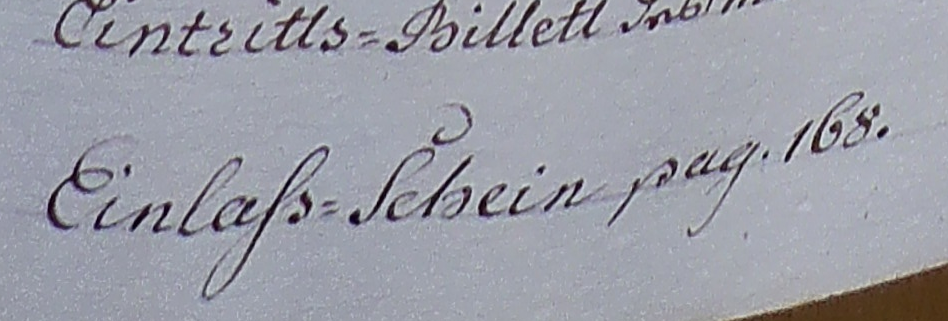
Einlass‗Schein pag. 168.
